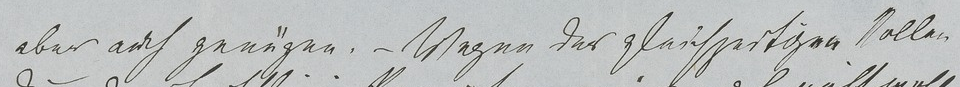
aber auch genügen. – Wegen der gleichzeitigen Vollen-
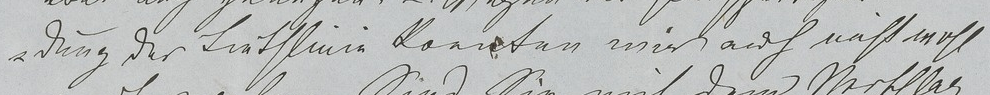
dung der Linthlinie konnten wir auch nicht wohl
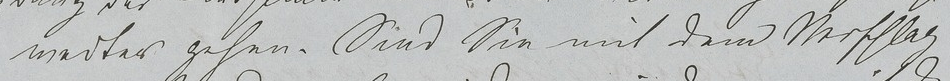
weiter gehen. Sind Sie mit dem Vorschlag
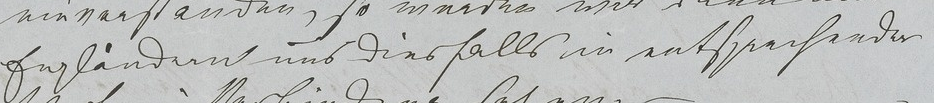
Engländern uns diesfalls in entsprechender
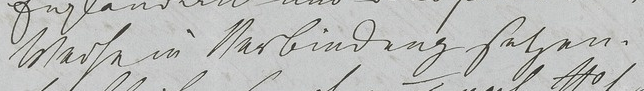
Weise in Verbindung setzen. –
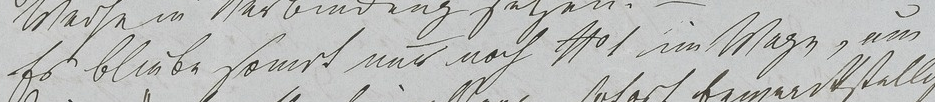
Es bliebe somit nur noch No 1 im Wege, um
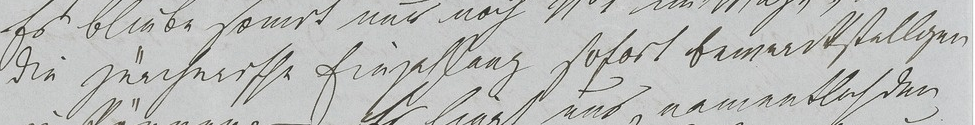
die zürcherische Einzahlung sofort bewerckstelligen
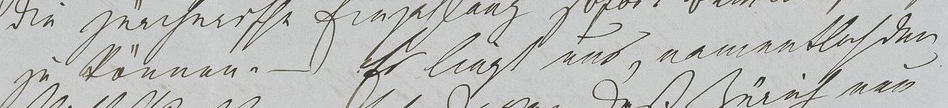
zu können. – Es liegt uns, namentlich den
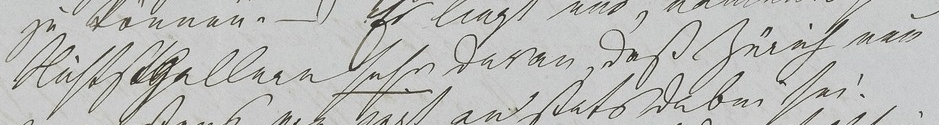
Nichtstgallernsehr daran, daß Zürich nun
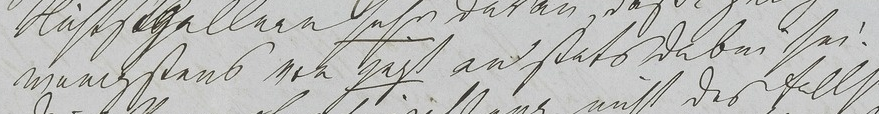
wenigstens von jezt an stets dabei sei.
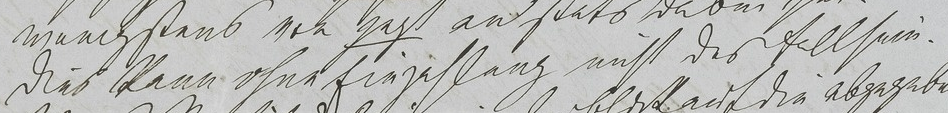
Dies kann ohne Einzahlung nicht der Fall sein.
